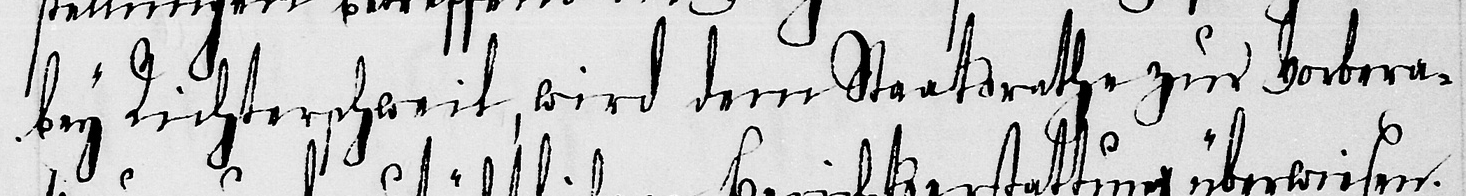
bey Richterschweil, wird dem Staatsrathe zur Vorbera¬
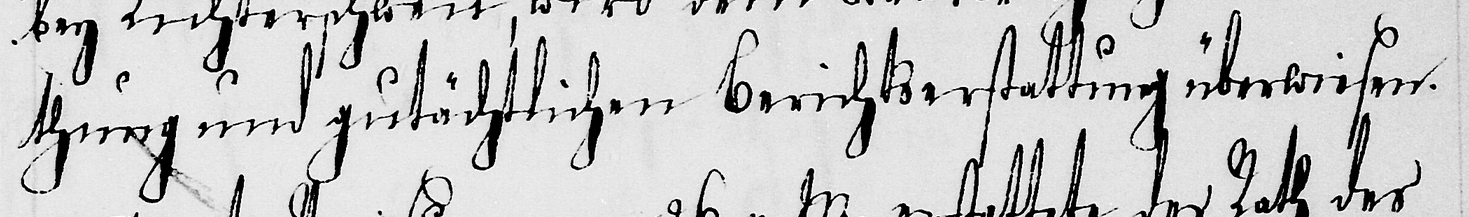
thung und gutächtlichen Berichterstattung überwiesen.
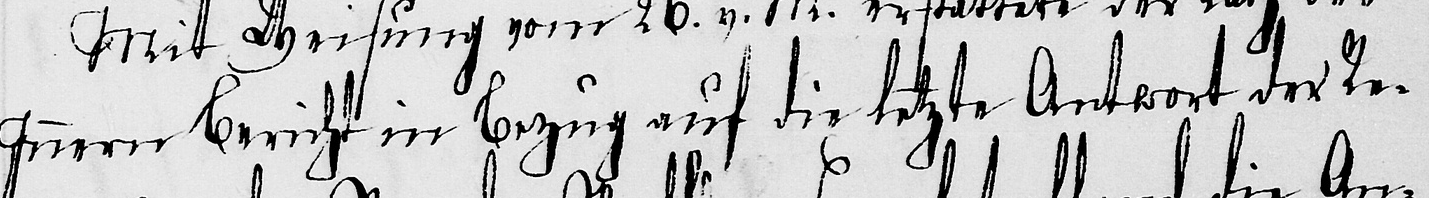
nnern Bericht in Bezug auf die letzte Antwort der Re¬
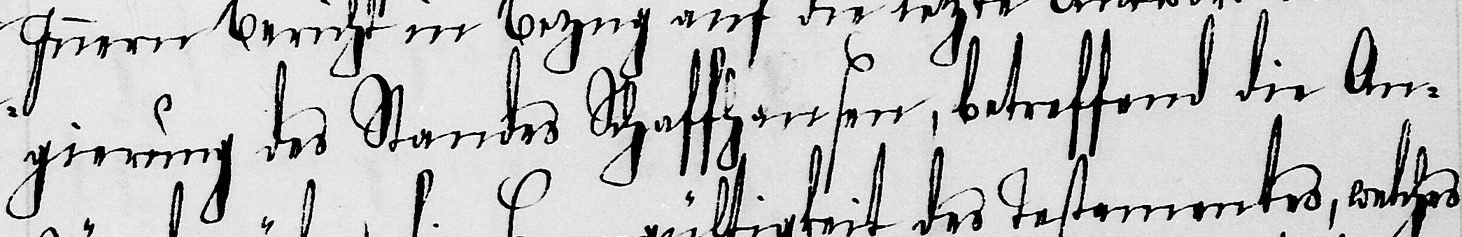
gierung des Standes Schaffhausen, betreffend die An¬
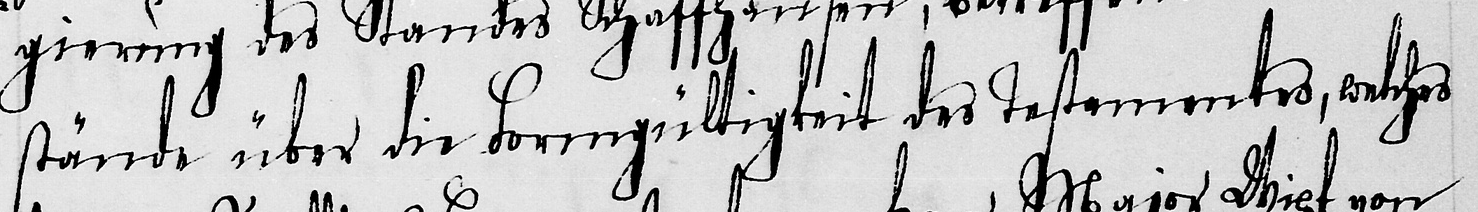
stände über die Formgültigkeit des Testamentes, welches
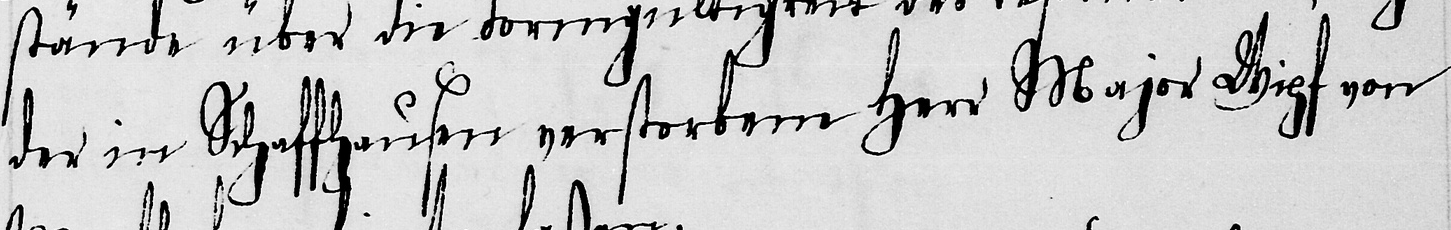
der in Schaffhausen verstorbene Herr Major Wipf von
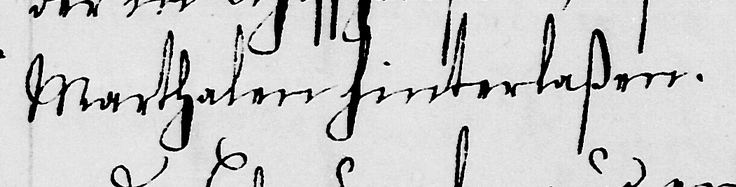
Marthalen hinterlaßen.
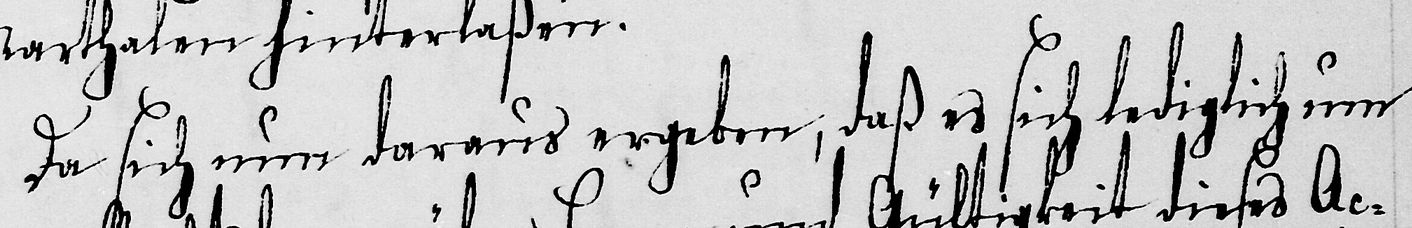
Da sich nun daraus ergeben, daß es sich lediglich um
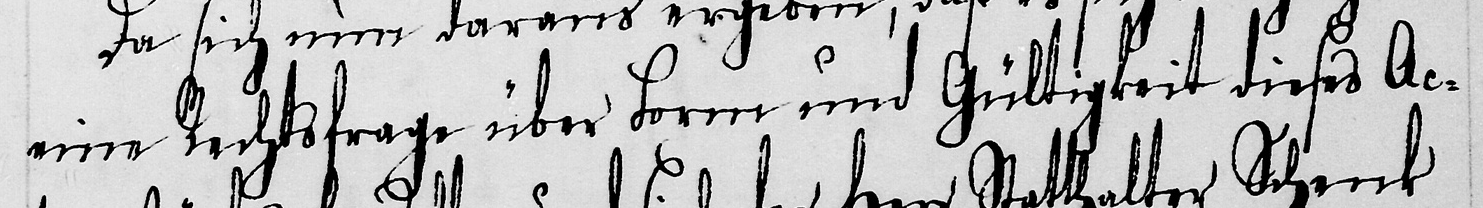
eine Rechtsfrage über Form und Gültigkeit dieses Ac¬
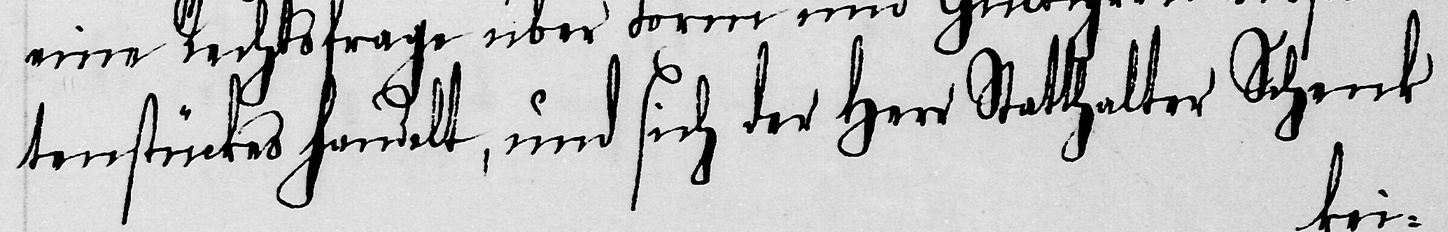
tenstückes handelt, und sich der Herr Statthalter
